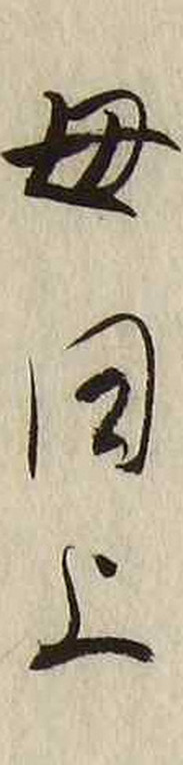母同上

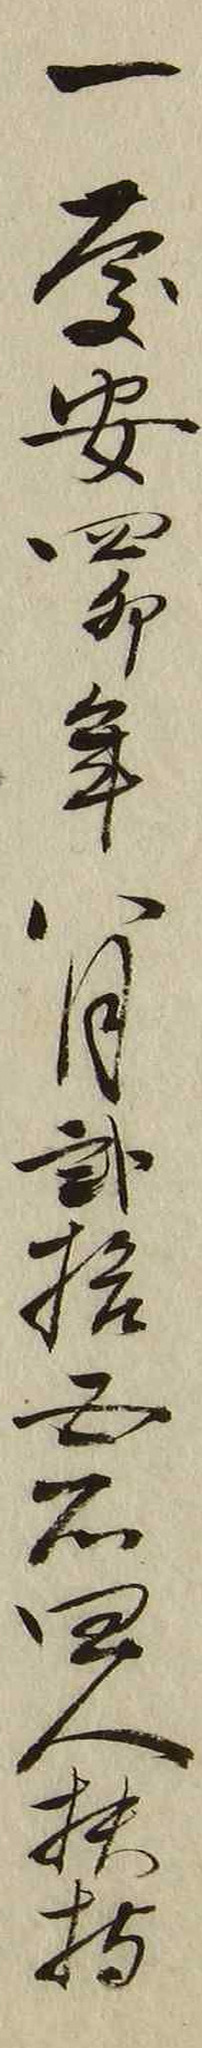一慶安四卯年八月弐拾五石四人扶持
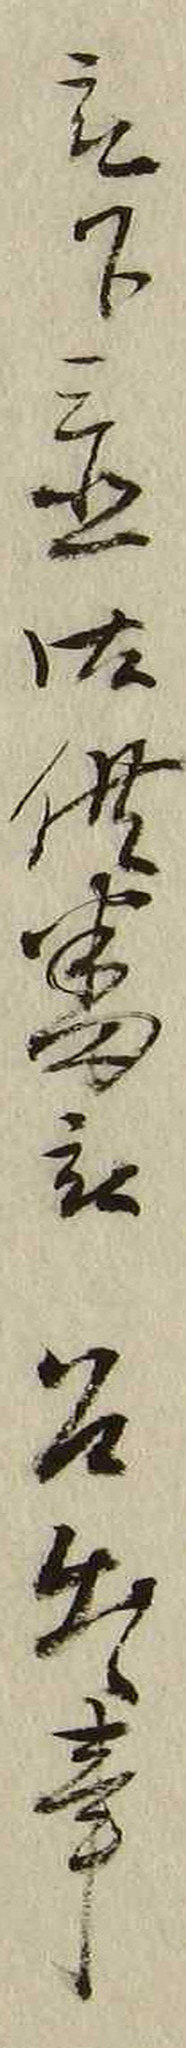被下置御供番被召出候事
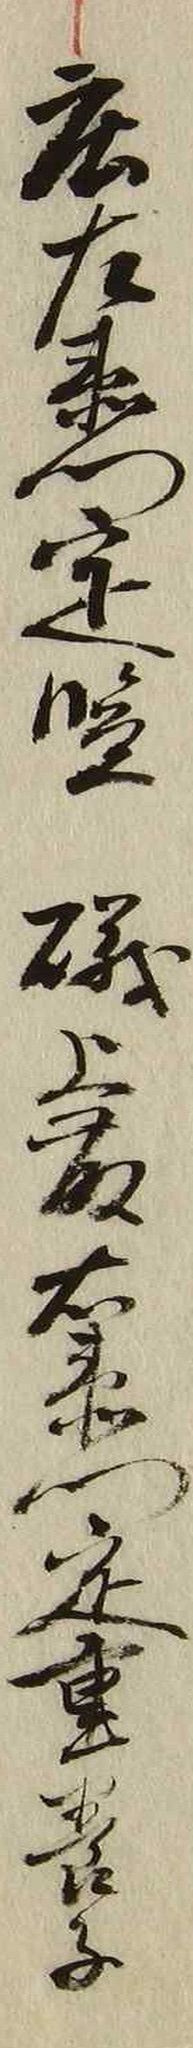庄左衛門定覧磯上藤右衛門定重養子
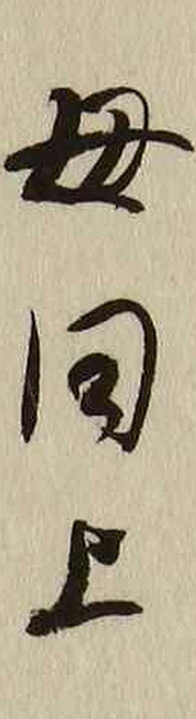母同上
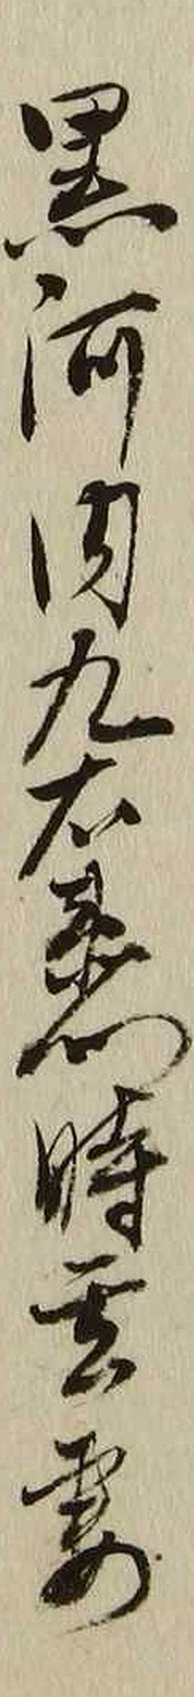女黒河内九右衛門時玄妻
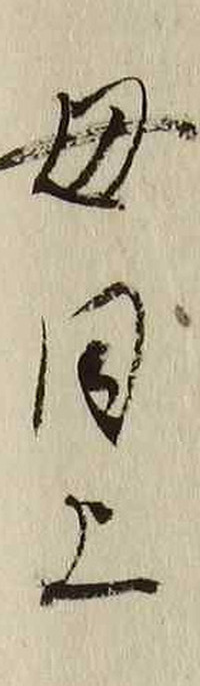母同上
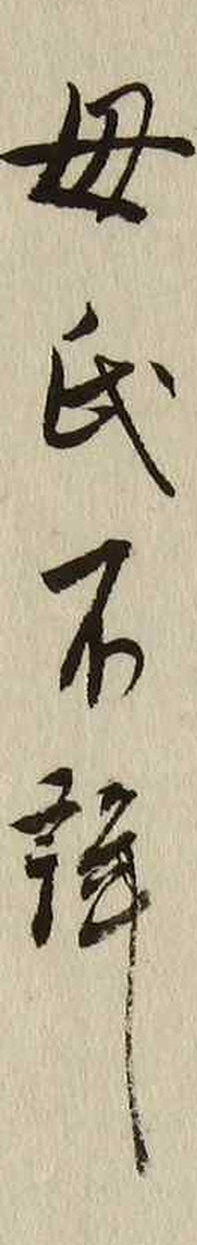母氏不詳
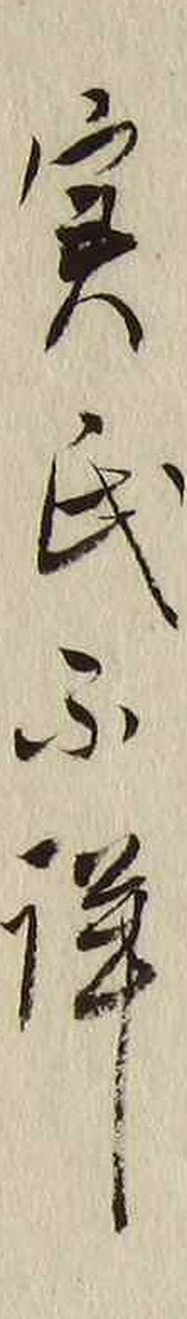実氏不詳
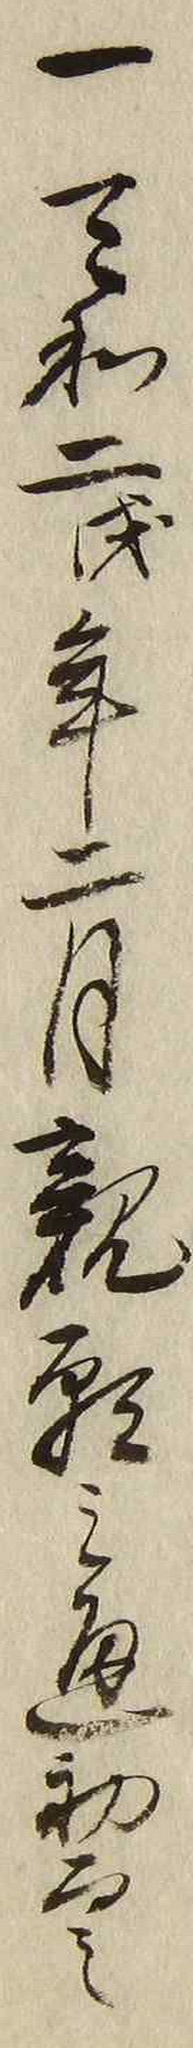一天和二戌年二月親願之通初而之

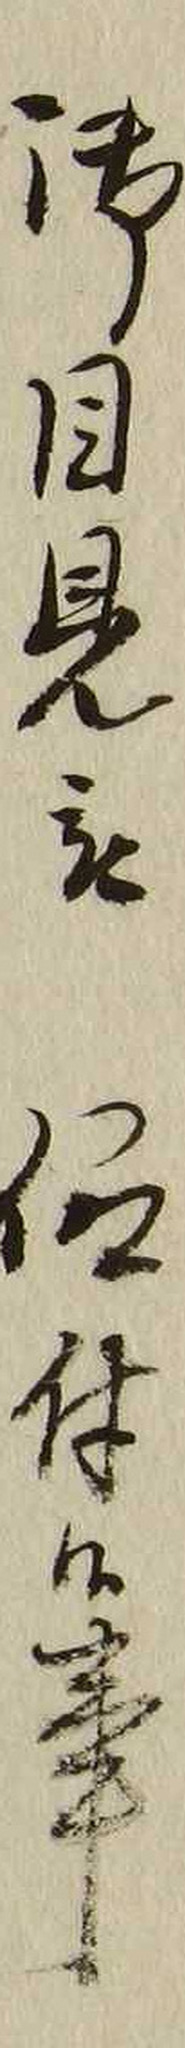御目見被仰付候事
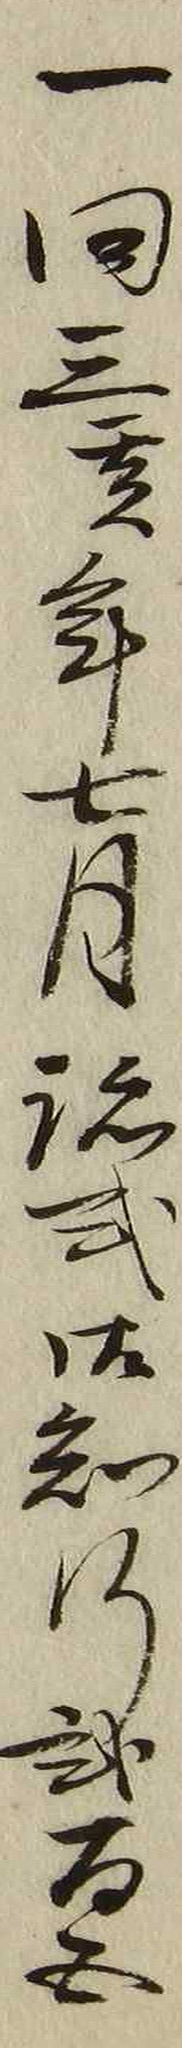一同三亥年七月跡式御知行弐百五
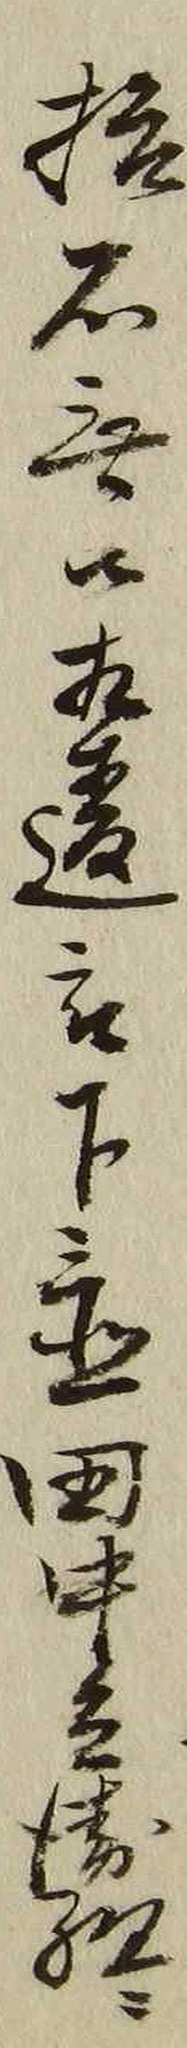拾石無御相違被下置田中兵衛組ニ
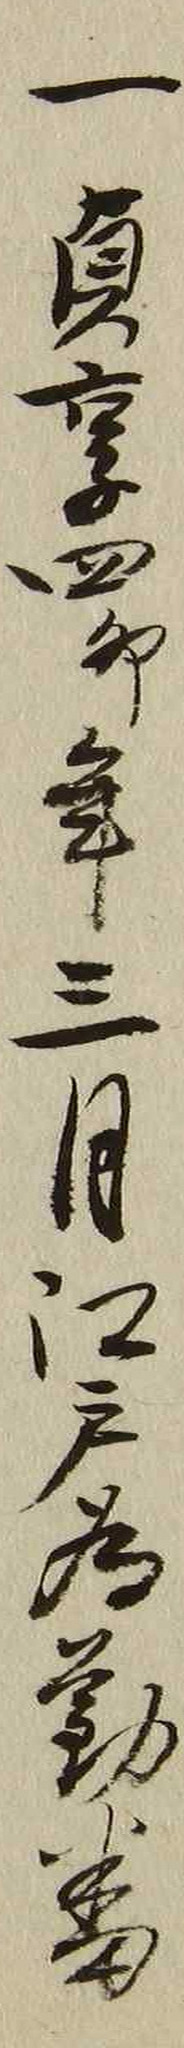一貞享四卯年三月江戸為勤番
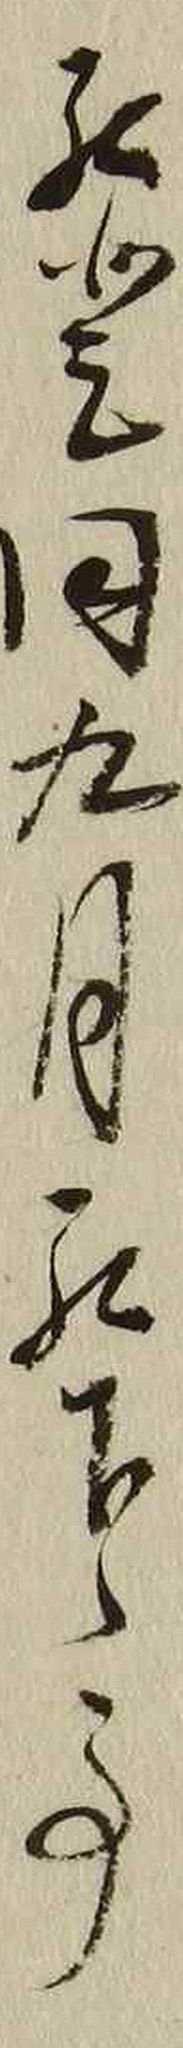罷登同九月罷下候事
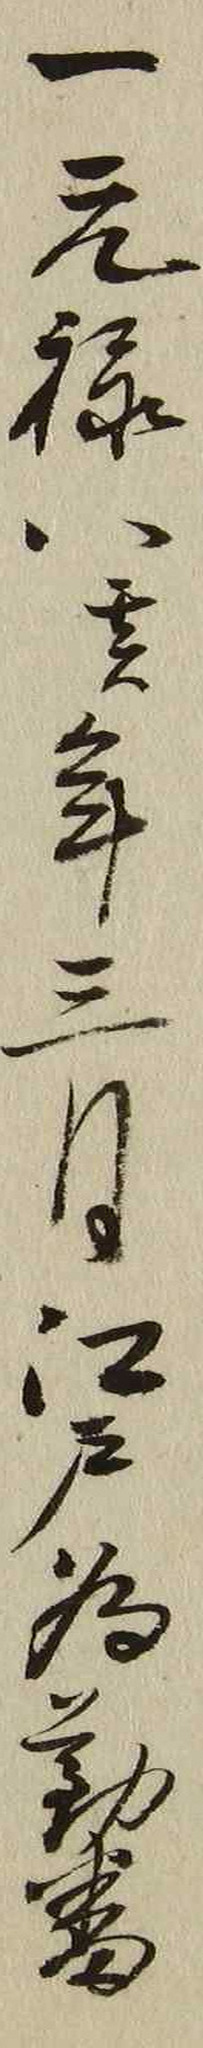一元禄八亥年三月江戸為勤番
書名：諸士系譜　巻之352　す之部2
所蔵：会津若松市立会津図書館
